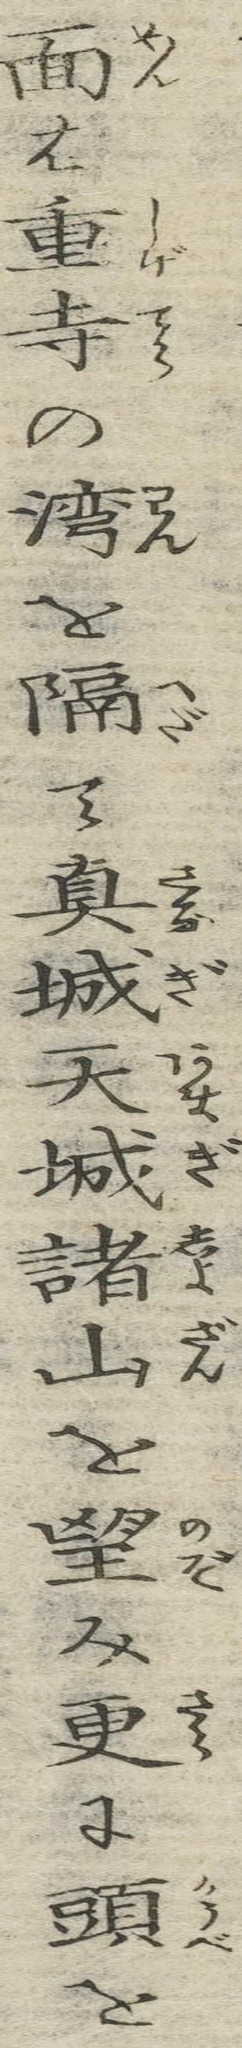面は重寺の湾を隔て真城天城諸山を望み更に頭を
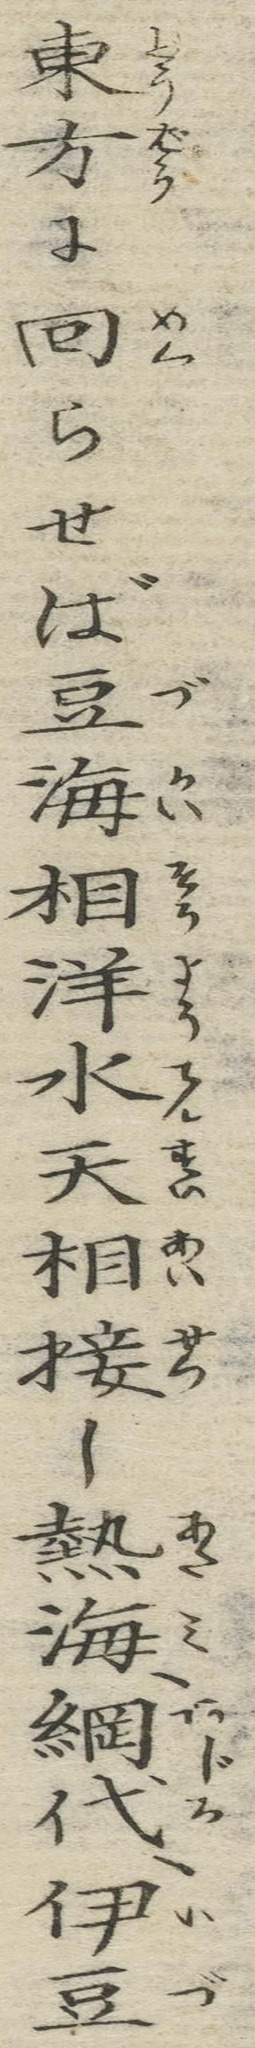東方に回らせば豆海相洋水天相接し熱海、網代、伊豆

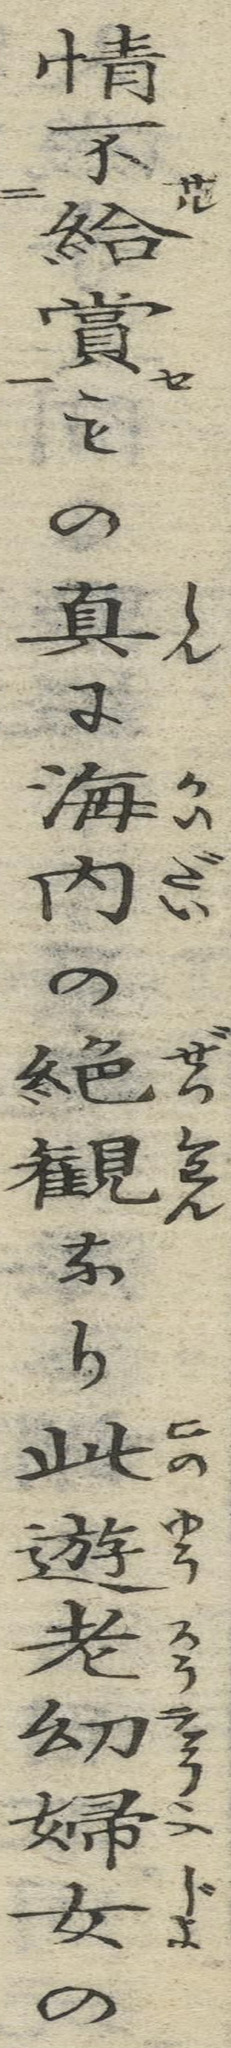情不給賞真に海内の絶観なり此遊老幼婦女の
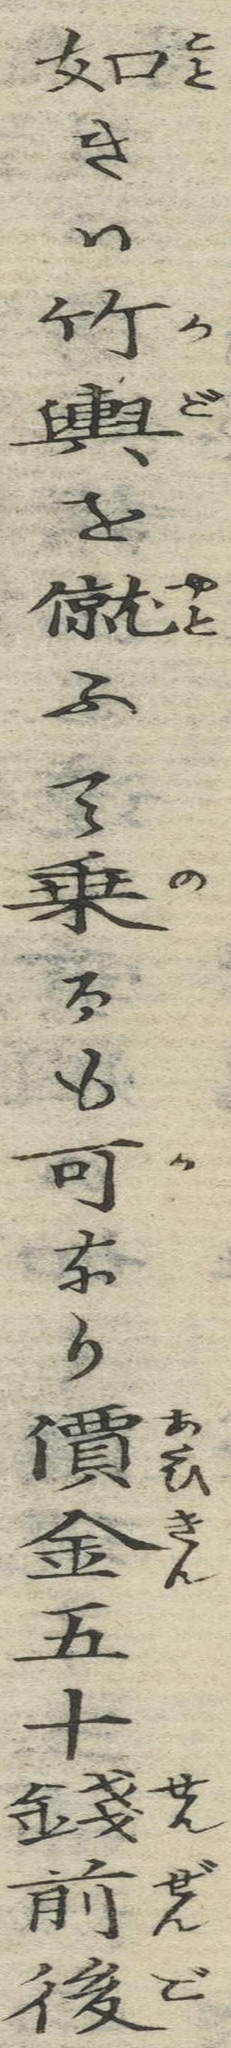如きは竹輿を僦ふて乗るも可なり価金五十銭前後
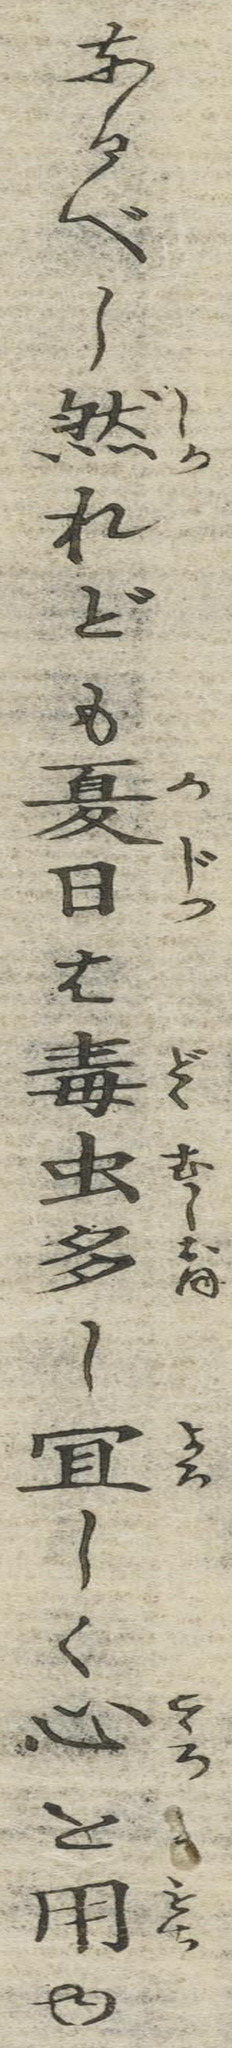なるべし然れども夏日は毒虫多し宜しく心を用ゆ
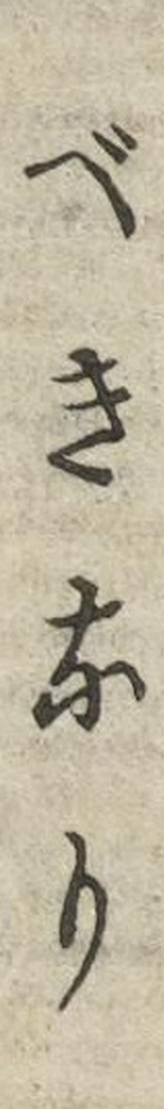べきなり
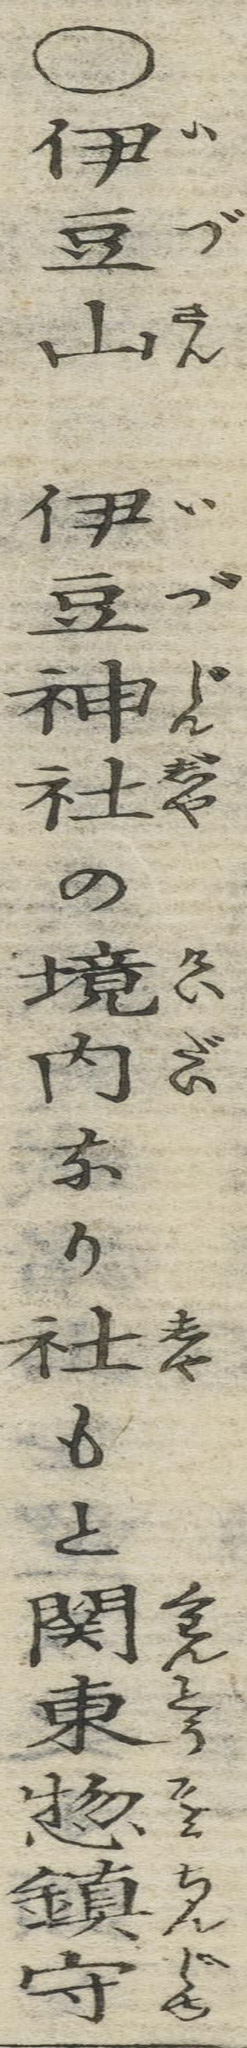○伊豆山伊豆神社の境内なり社もと関東惣鎮守
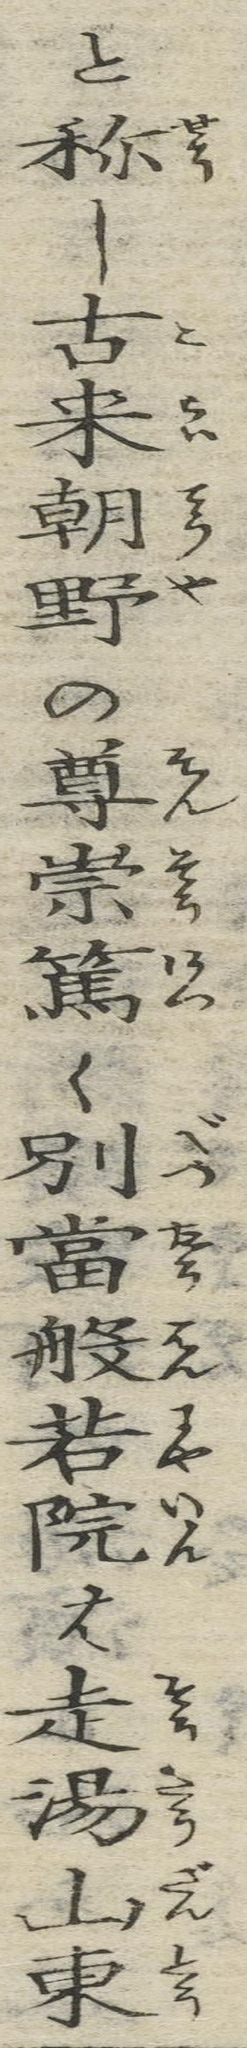と称し古来朝野の尊崇篤く別当般若院は走湯山東
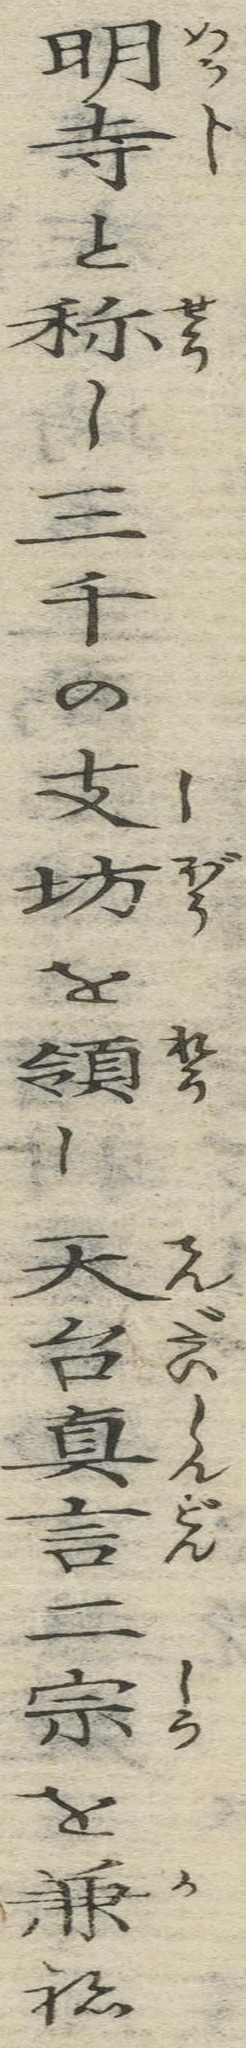明寺と称し三千の支坊を領し天台真言二宗を兼ね
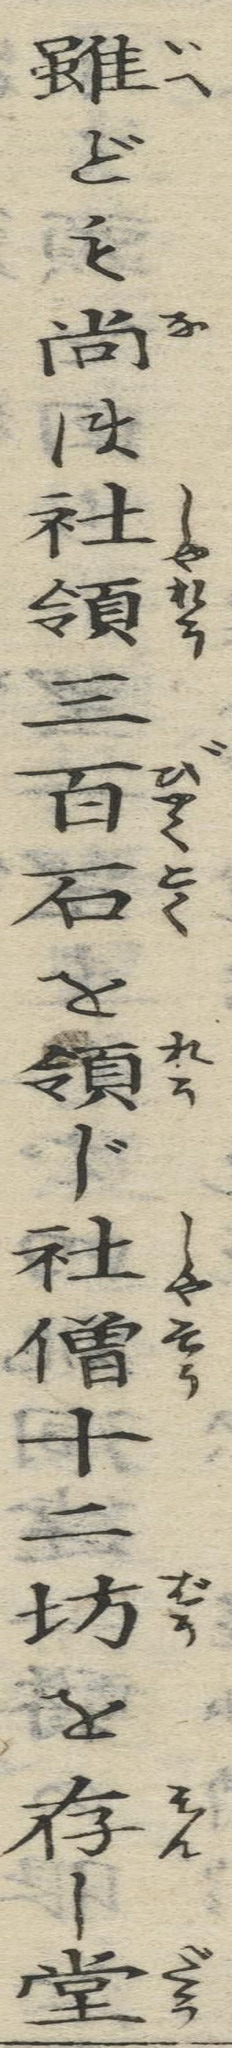雖ども尚ほ社領三百石を領じ社僧十二坊を存し堂
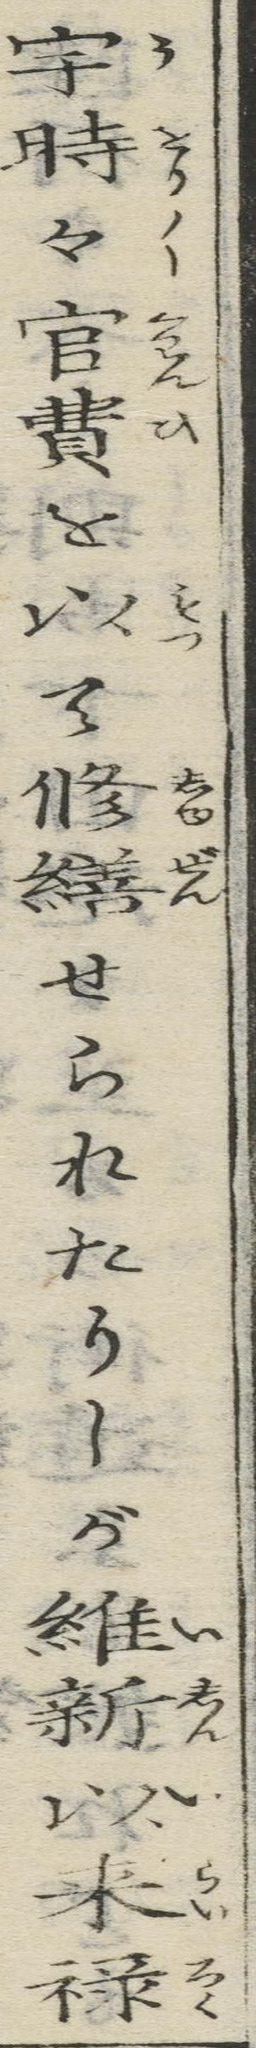宇時々官費を以て修繕せられたりしが維新以来禄
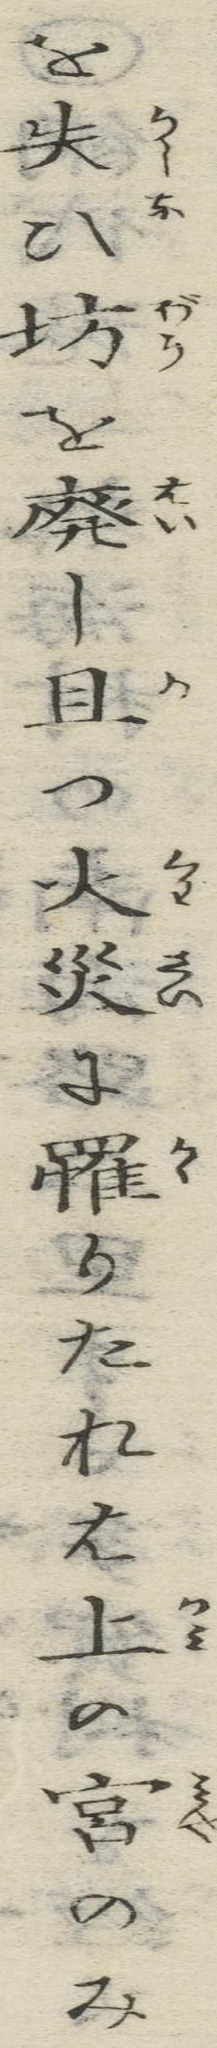を失ひ坊を廃し且つ火災に罹りたれは上の宮のみ
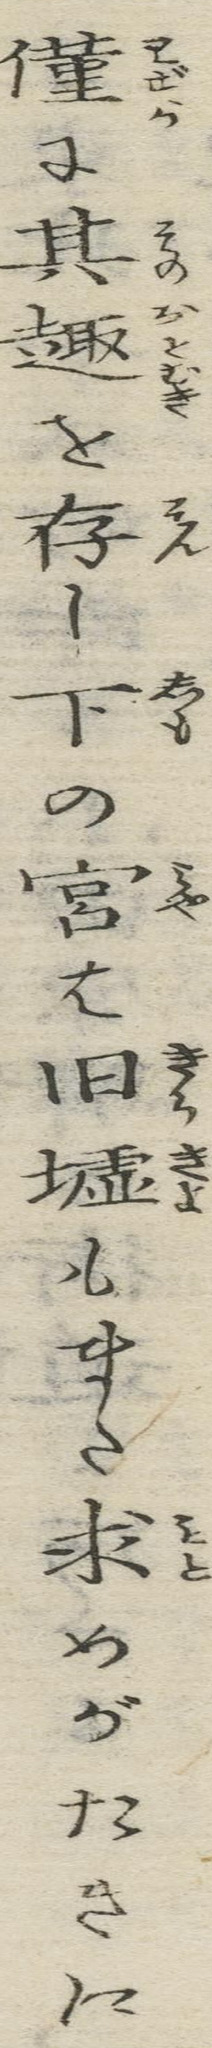僅に其趣を存し下の宮は旧墟もまた求めがたきに
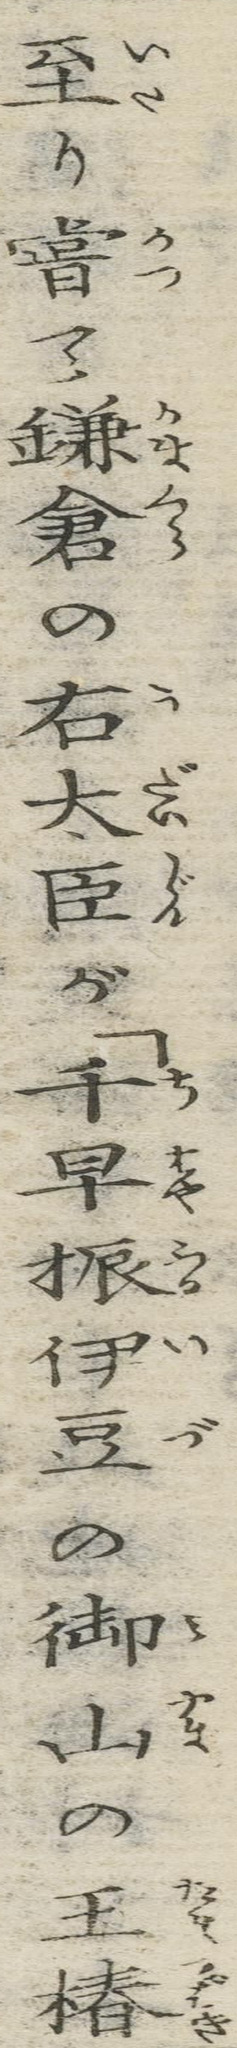至り嘗て鎌倉の右大臣が「千早振伊豆の御山の玉椿
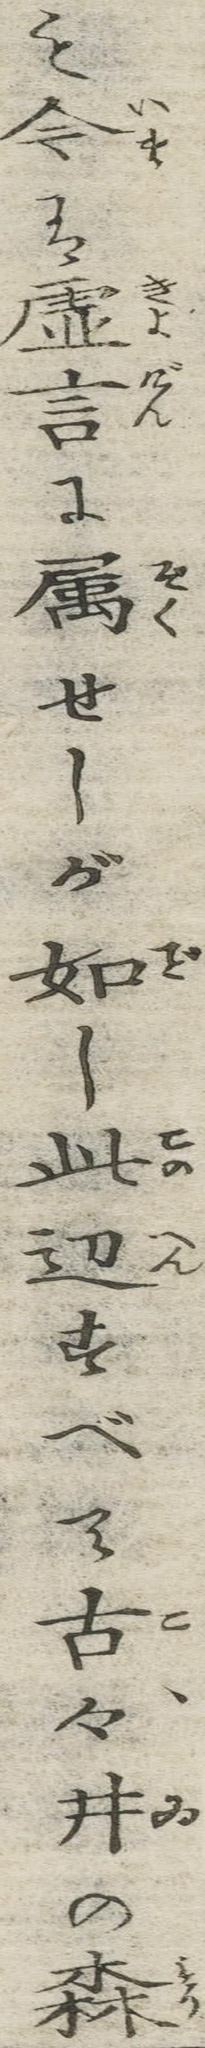も今は虚言に属せしが如し此辺すべて古々井の森
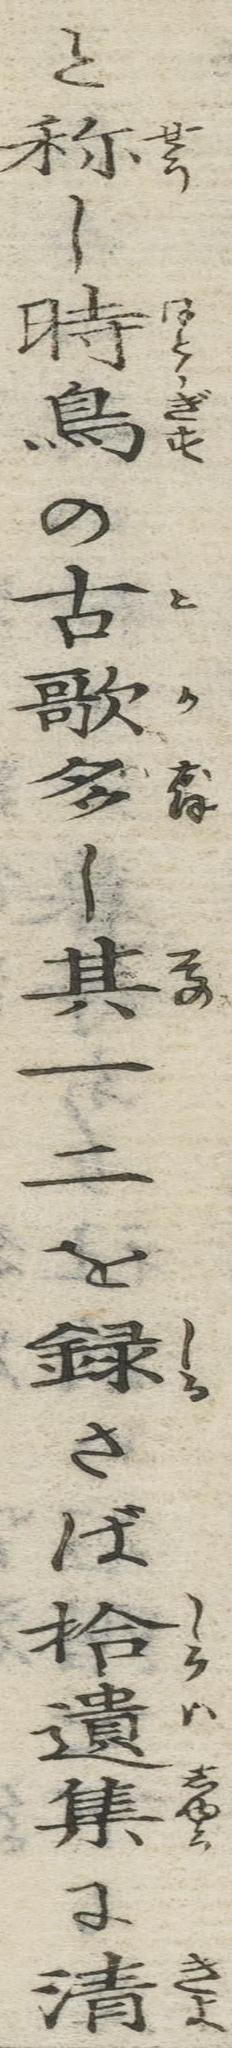と称し時鳥の古歌多し其一二を録さば拾遺集に清
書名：豆州熱海誌　完
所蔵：東京大学地震研究所図書室 Earthquake Research Institute Library, The University of Tokyo, JAPAN
